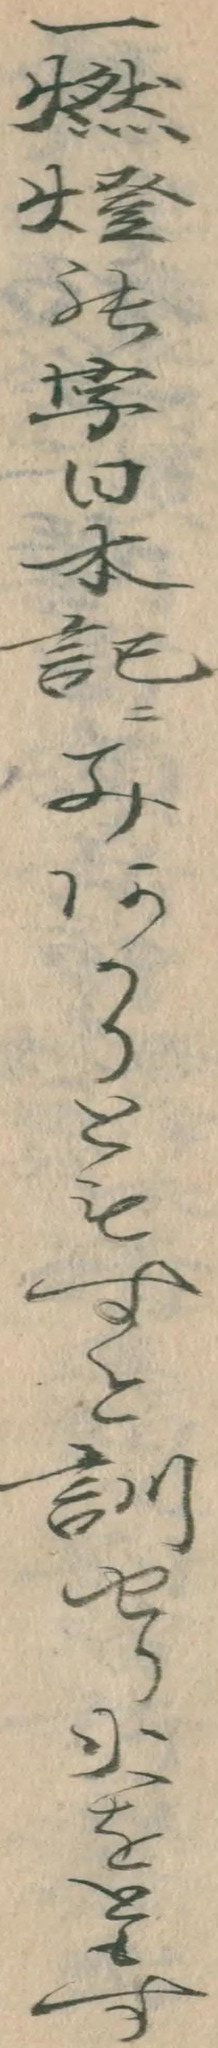一燃燈の字日本記ニみあかりともすと訓せり火をともす
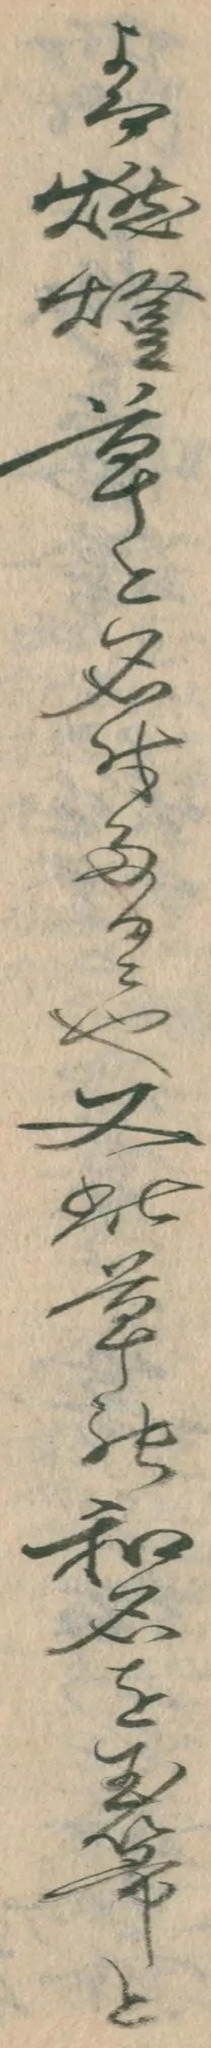よる燃燈草と名付たるニや又此草の和名を玉箒と
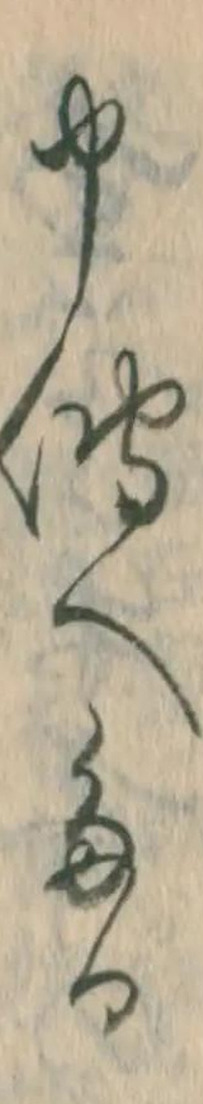申伝へたる
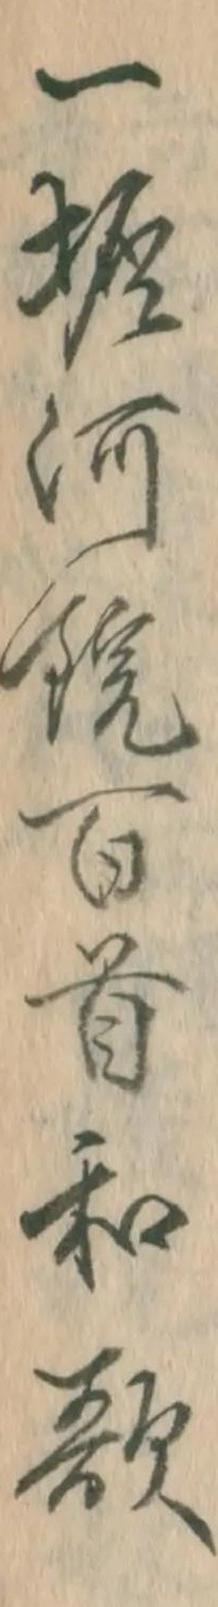一堀河院百首和歌

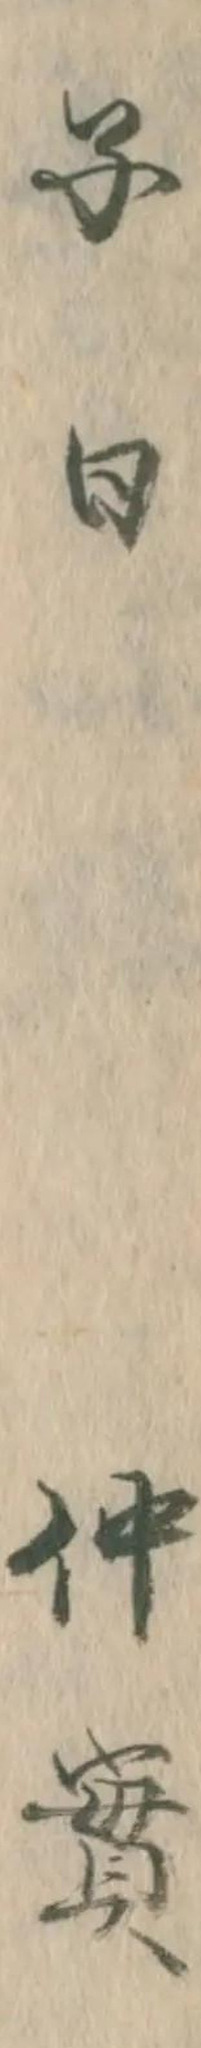子日仲実
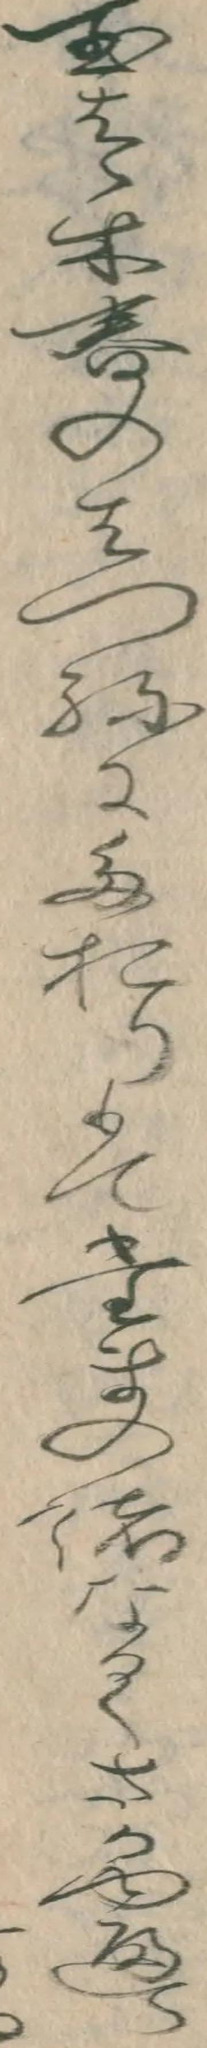玉はゝ木春のはつねにたおりもてたまの緒なるくさかゆへ
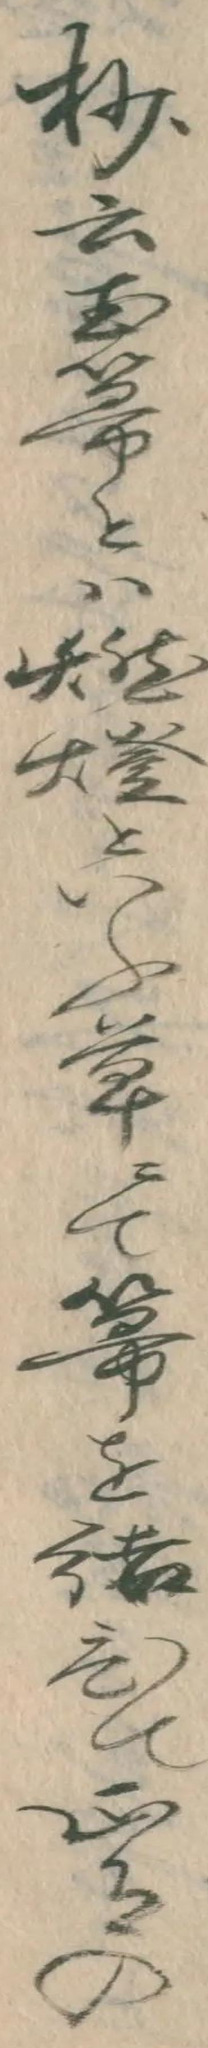抄云玉箒とは燈燈といふ草ニて箒を結ひて正有の
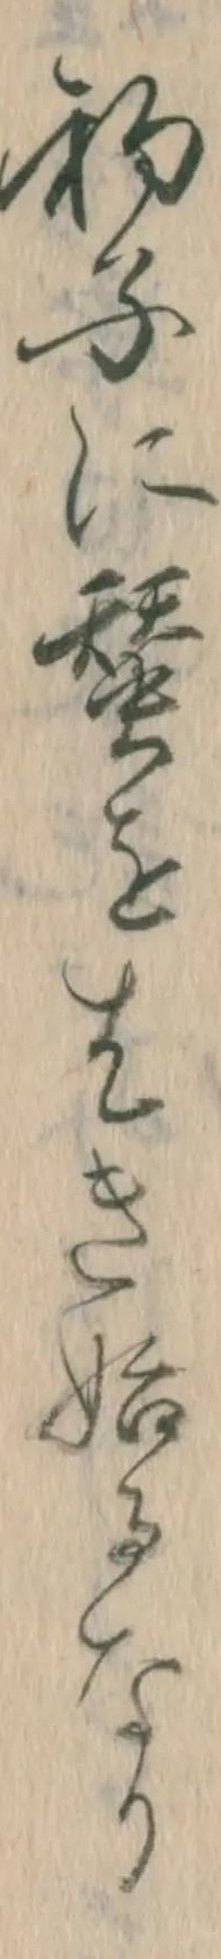初子に蚕をはき始るなり
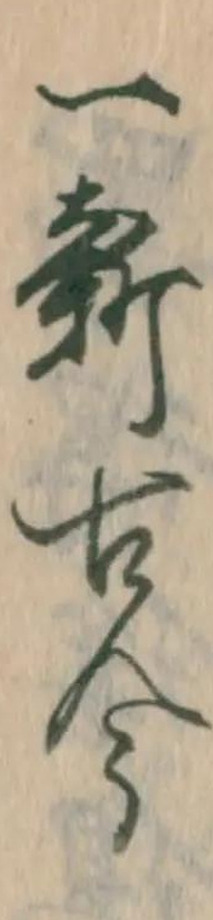一新古今
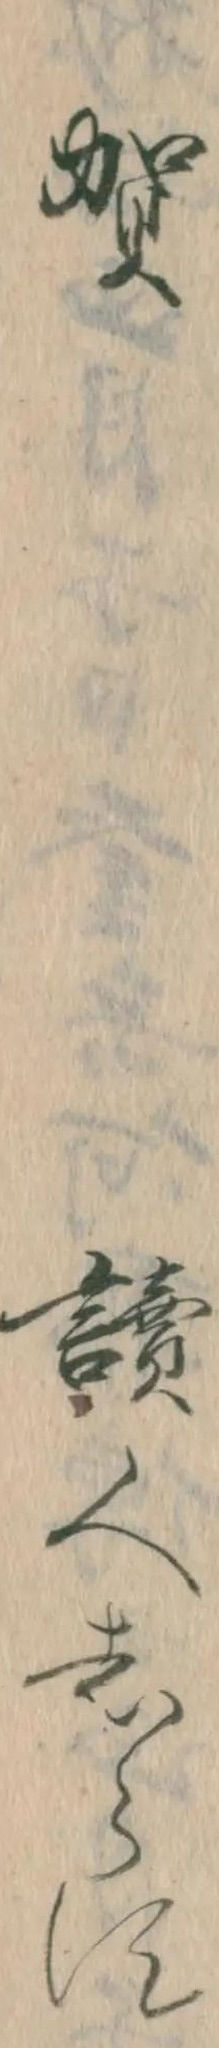賀詠人しらす
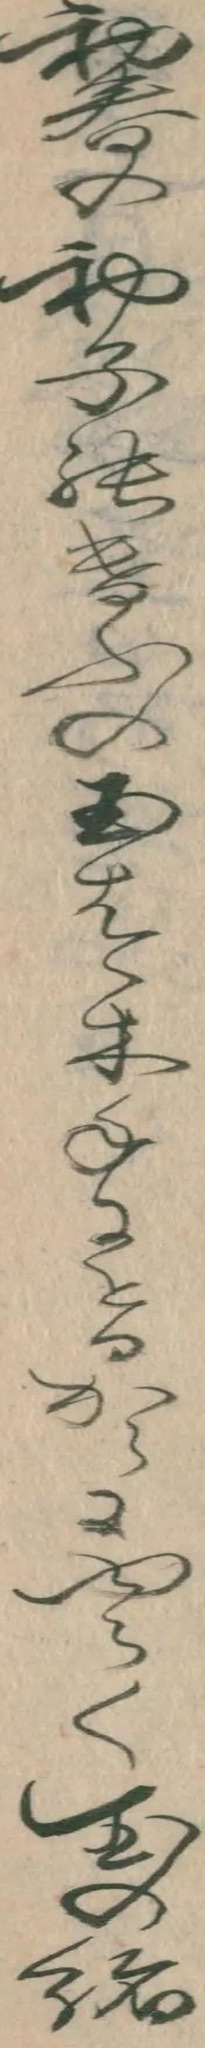初春の初子のけふの玉はゝ木手にとるからにゆらく玉の緒
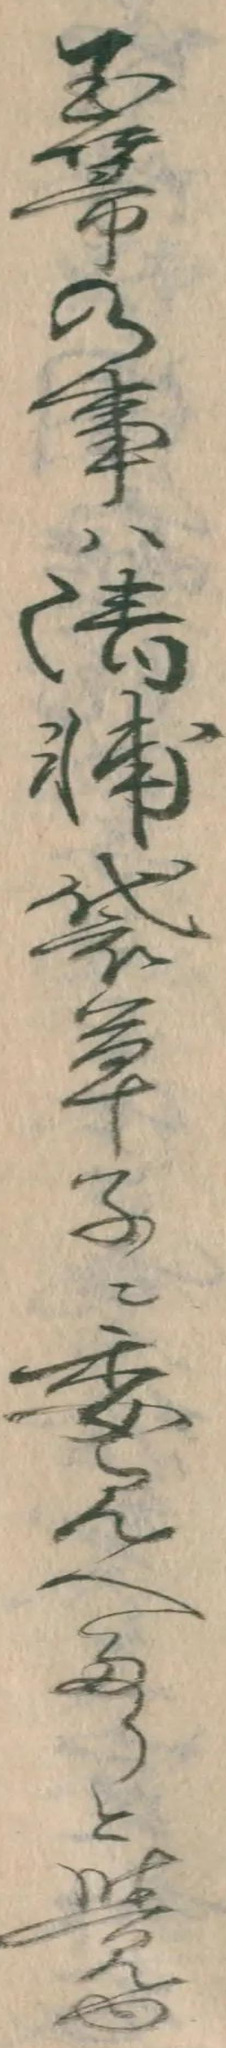玉箒の事は清輔袋草子ニ委見へたりと覚ゆ
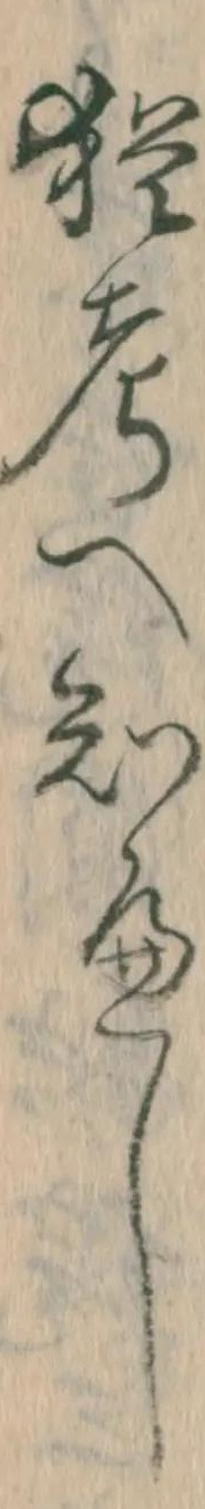猶考へ知へし
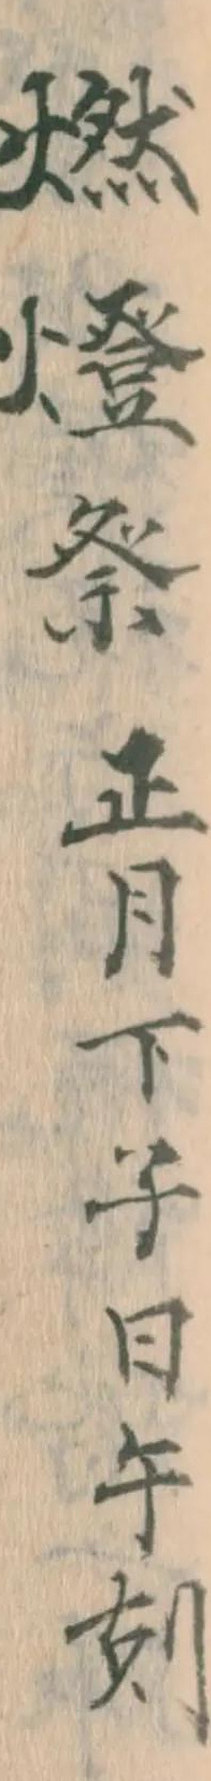燃燈祭正月下子日午刻
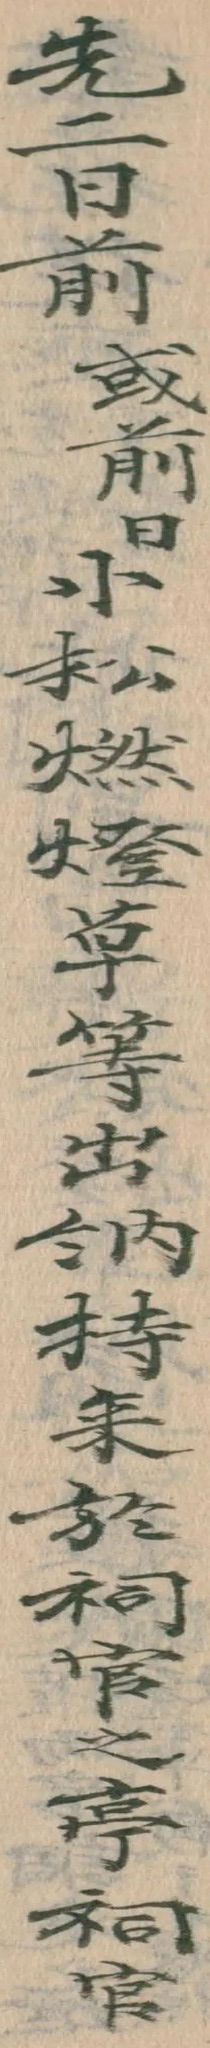先二日前或前日小松燃燈草等出納持来於祠官之亭祠官

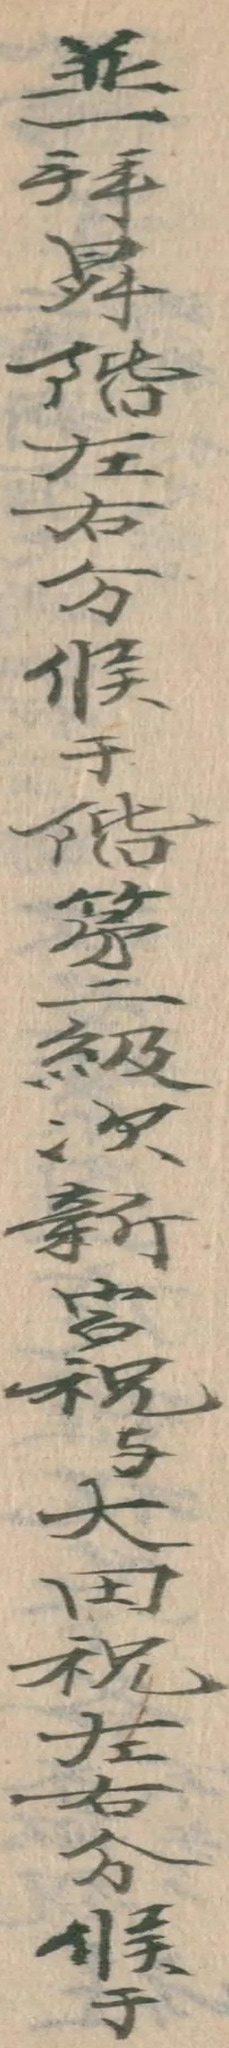並一拝昇階左右分候于階第二級次新宮祝与大田祝左右分候于
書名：賀茂社記録. 第9冊
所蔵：国立国会図書館 National Diet Library, JAPAN
